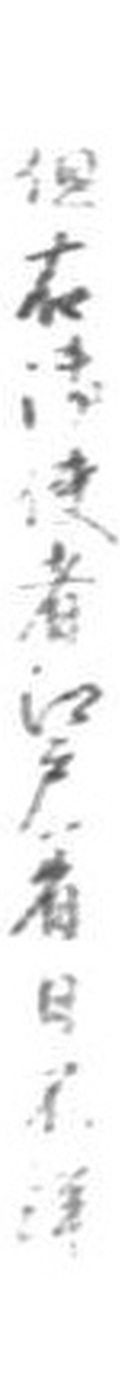但右御使者江戸着日不詳
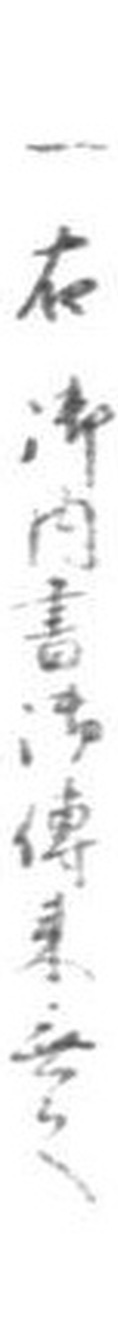一右御内書御伝来無之
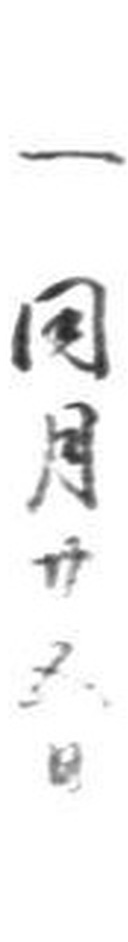一同月廿五日
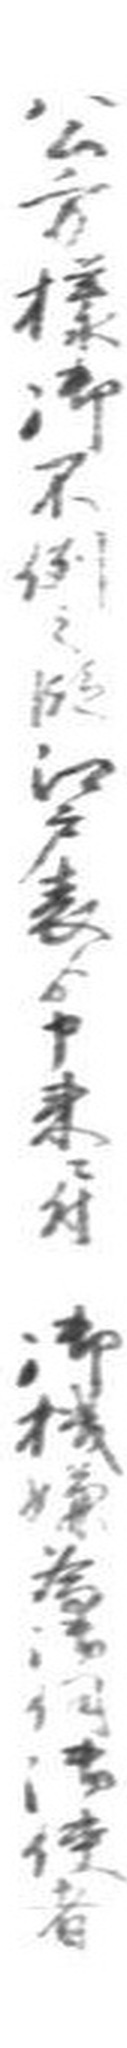公方様御不例之段江戸表ゟ申来ニ付御機嫌為御伺御使者

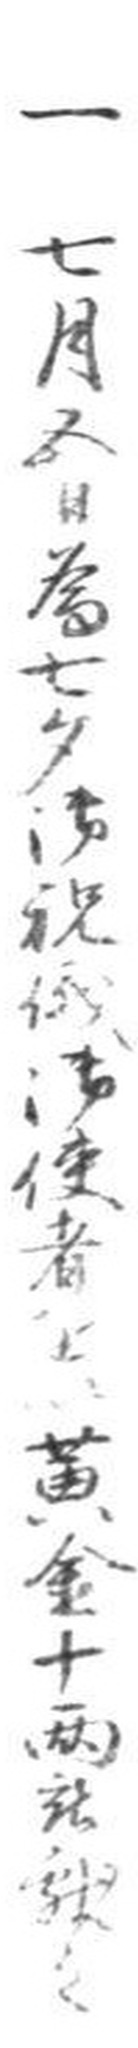一七月五日為七夕御祝儀御使者を以黄金十両被献之
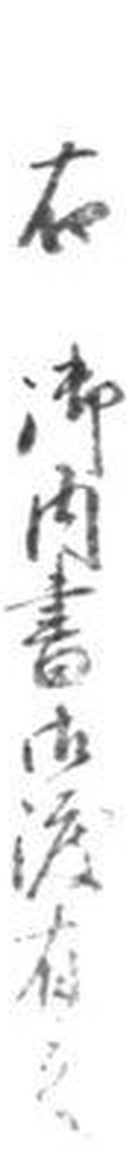右御内書御渡有之
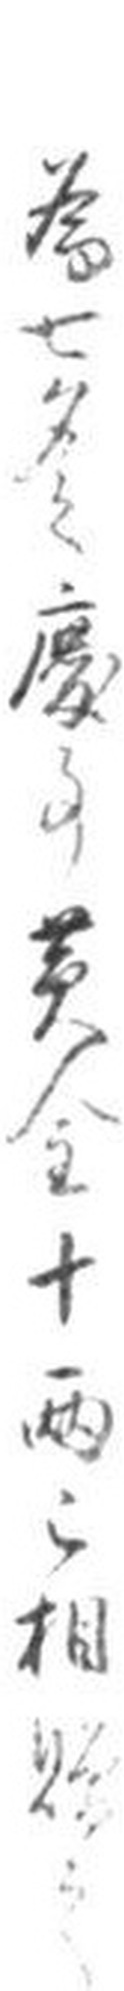為七夕之慶事黄金十両被相贈之
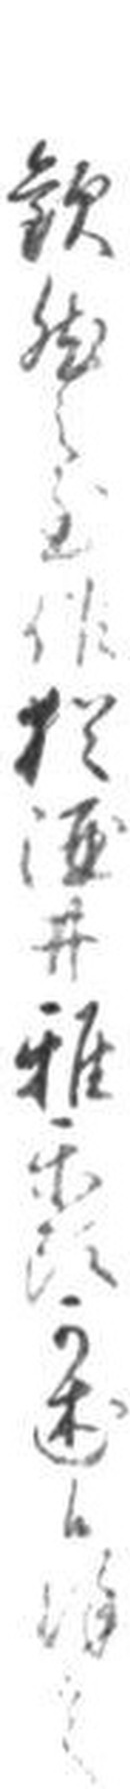歓然之至候猶酒井雅楽頭可述候謹言
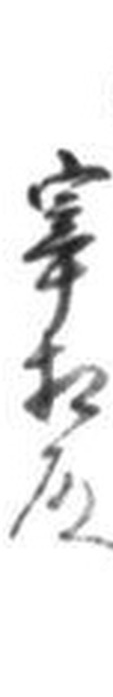宰相殿
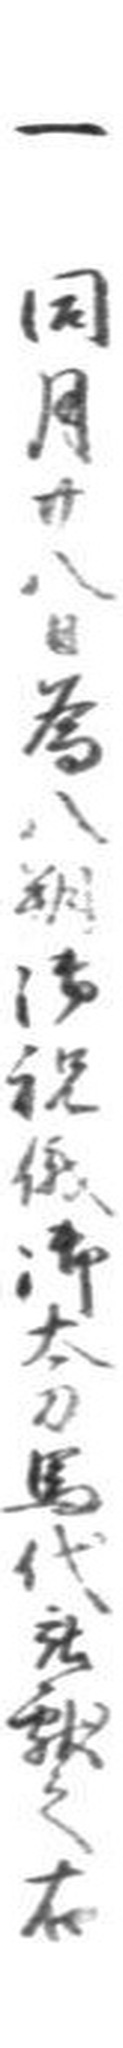一同月廿八日為八朔御祝儀御太刀馬代被献之右
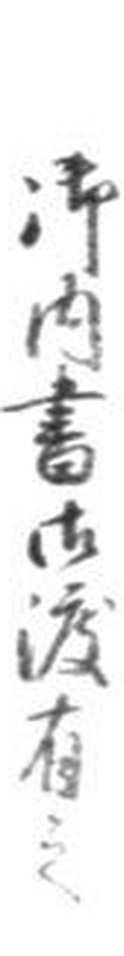右御内書御渡有之
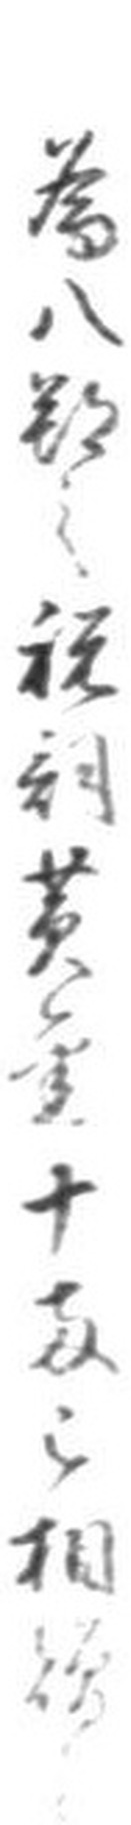為八朔之祝詞黄金十両被相贈之
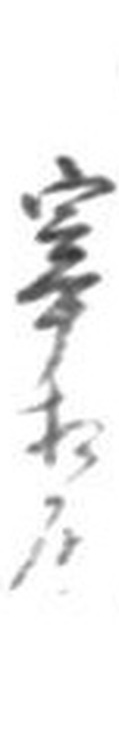宰相殿
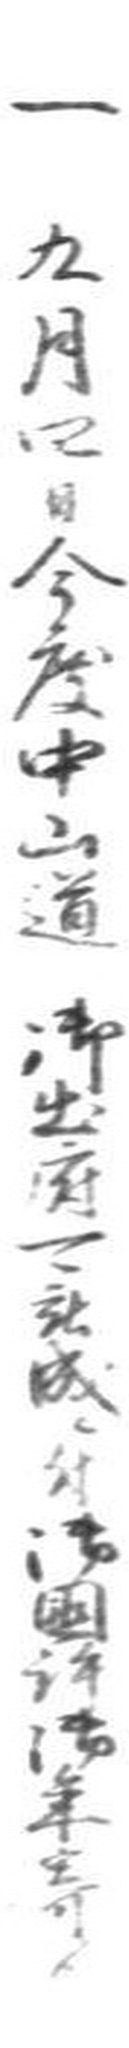一九月四日今度中山道御出府可被成ニ付御国許御年寄ゟ
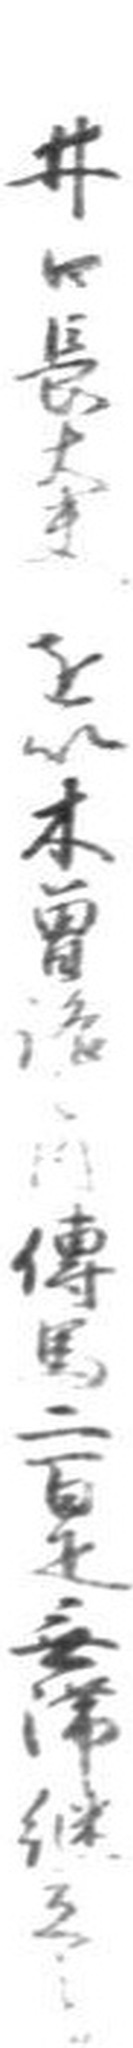井口長太夫を以木曾路之内伝馬二百疋無滞継立之儀

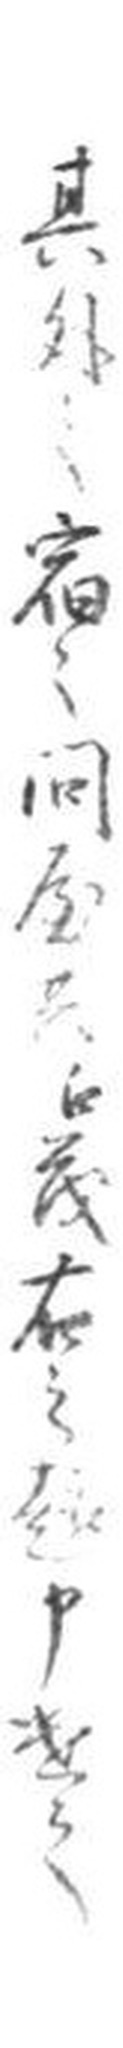其外之宿々問屋共江も右之趣申遣之
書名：家譜 三 忠昌公 従慶長八年到寛永六年
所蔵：福井県文書館 Fukui Prefectural Archives
